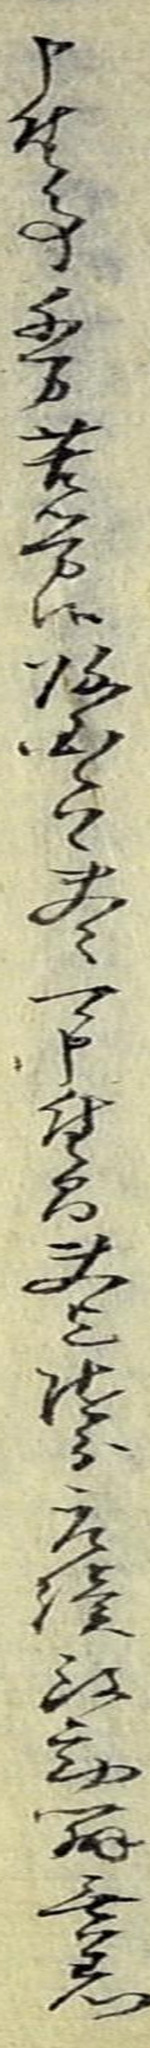申付候事千万苦労候帰国候ハヽ夫々可申付候間夫迄随分取続致勘弁無恙
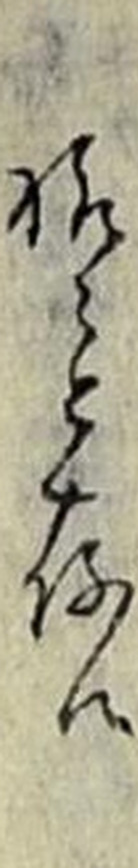様ニと存候
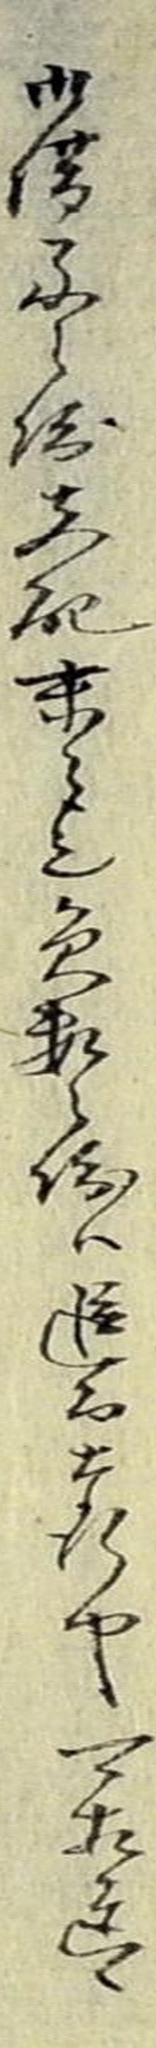御借米之儀支配末々迄員数之儀ハ追而奉行中可相達候
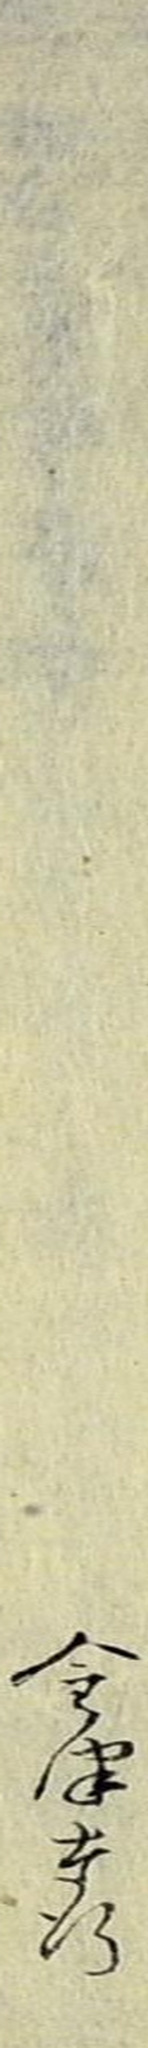金津奉行
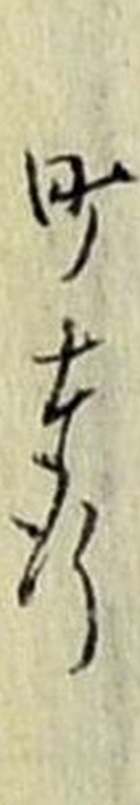町奉行
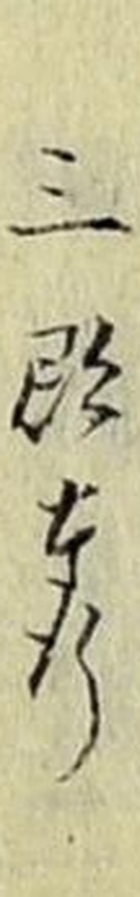三郡奉行
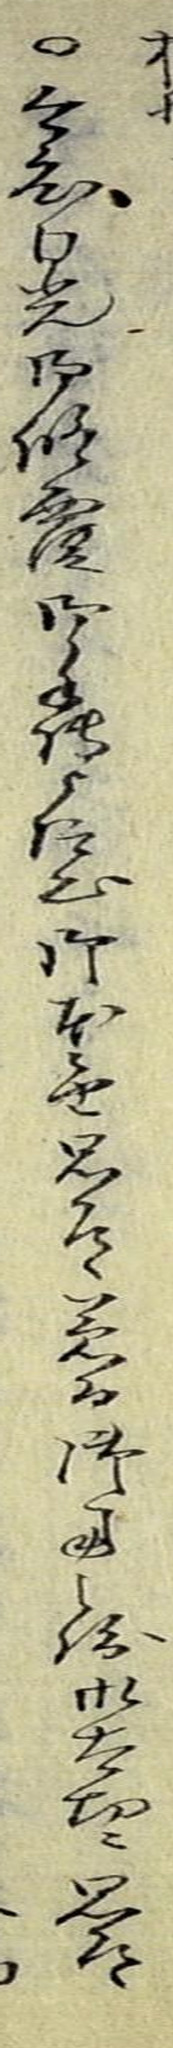〇今度日光御修覆御手伝被仰出本望思召候兼而御用之儀御太切ニ思召候
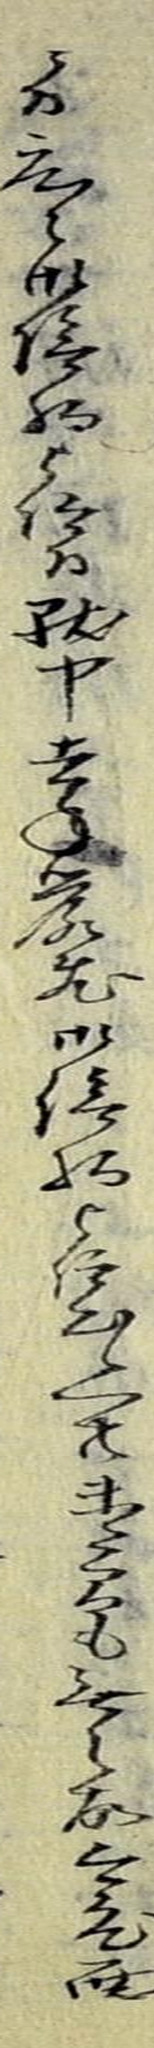ニ付度々御倹約被仰付就中去年厳敷御倹約被仰出候へ共未た間も無之故今度面
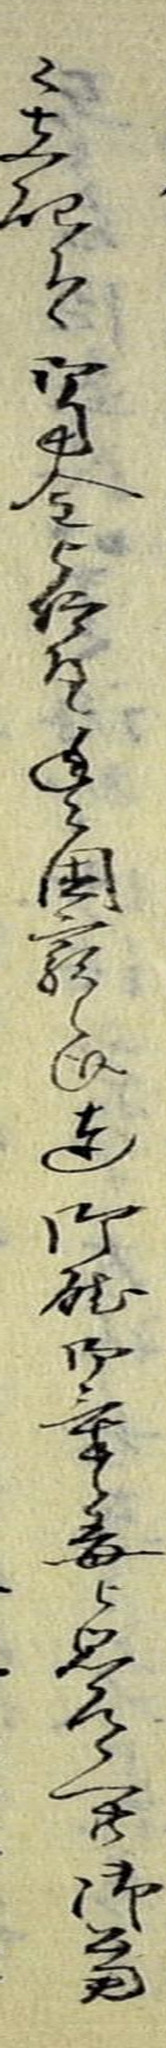々支配下へ御用金被仰付候年々困窮之趣達御聴御気之毒被思召候へ共御公用
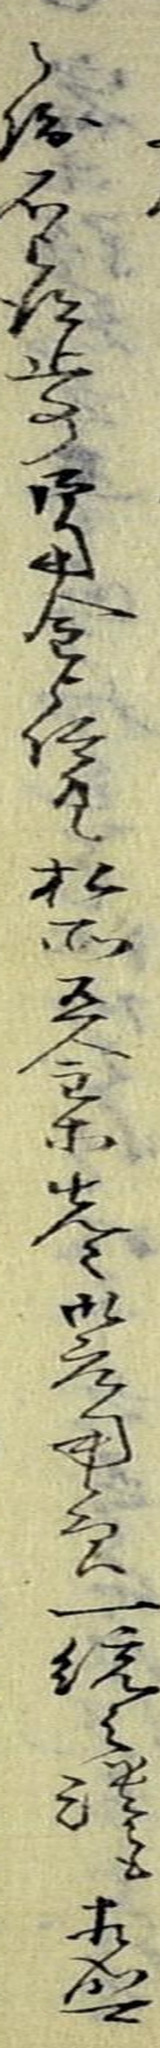之儀不被得止事御用金被仰付候札所有金等先々御取用候而ハ一統潰ニも相成可
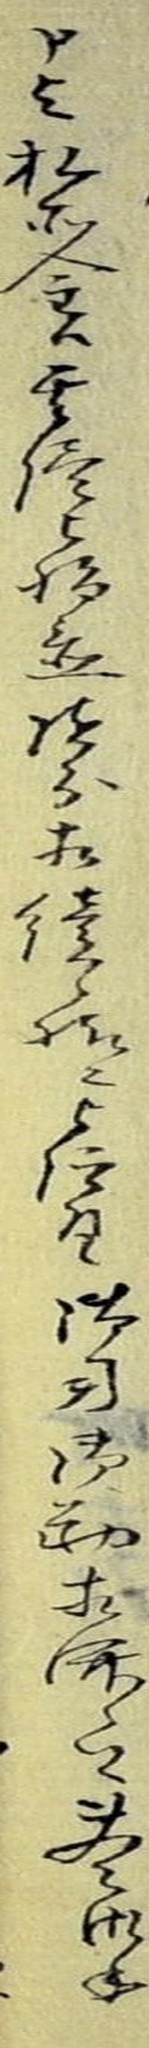申与札所金ハ其儘被指置随分相続候様ニ被仰付候御用御勤相済候ハヽ夫々御手
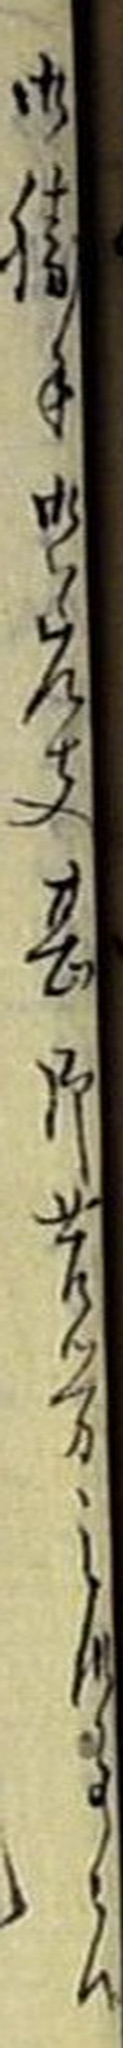御勝手御差支甚御苦労之御事ニ候
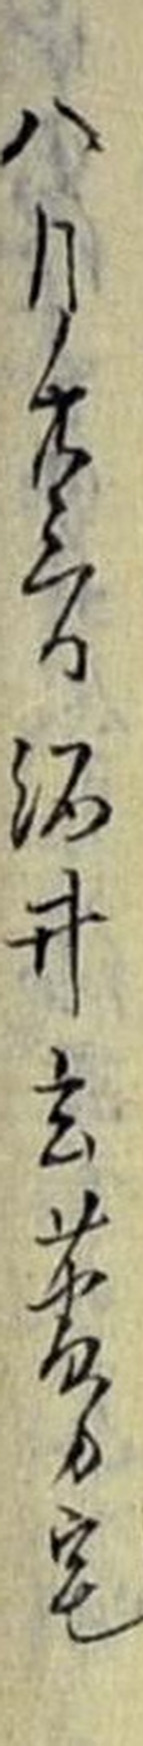八月廿三日酒井玄蕃方宅
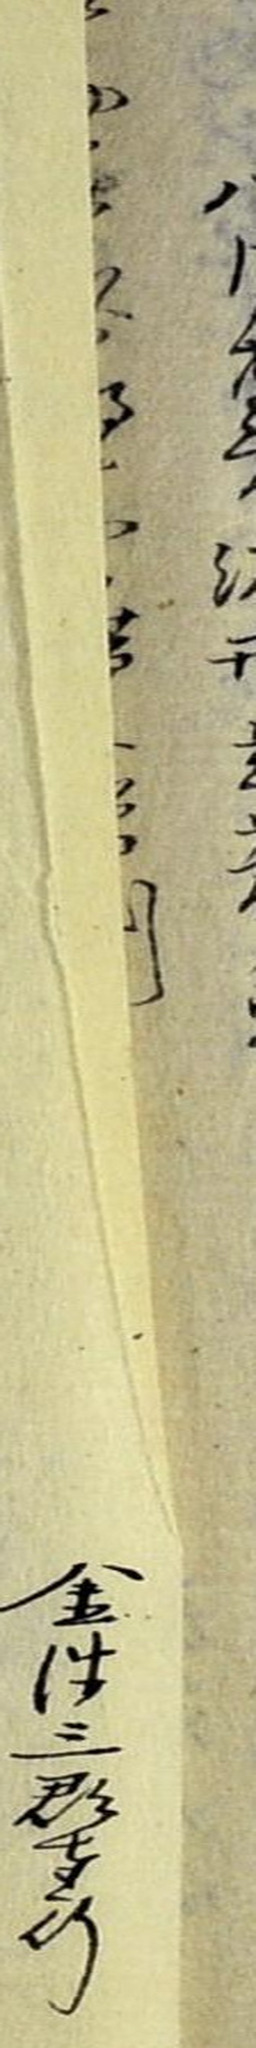金津三郡奉行
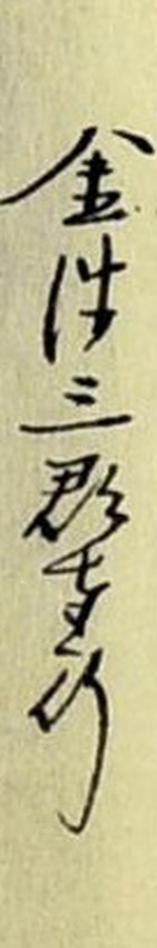金津三郡奉行
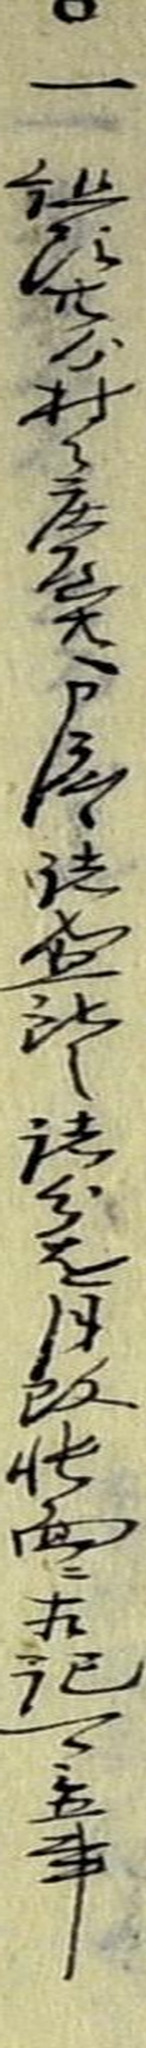〇一組頭共ゟ村々庄屋共へ申渡候諸盛銀之諸分を月改帳面ニ相記可置事
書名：命令之部 一
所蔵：福井県文書館 Fukui Prefectural Archives
